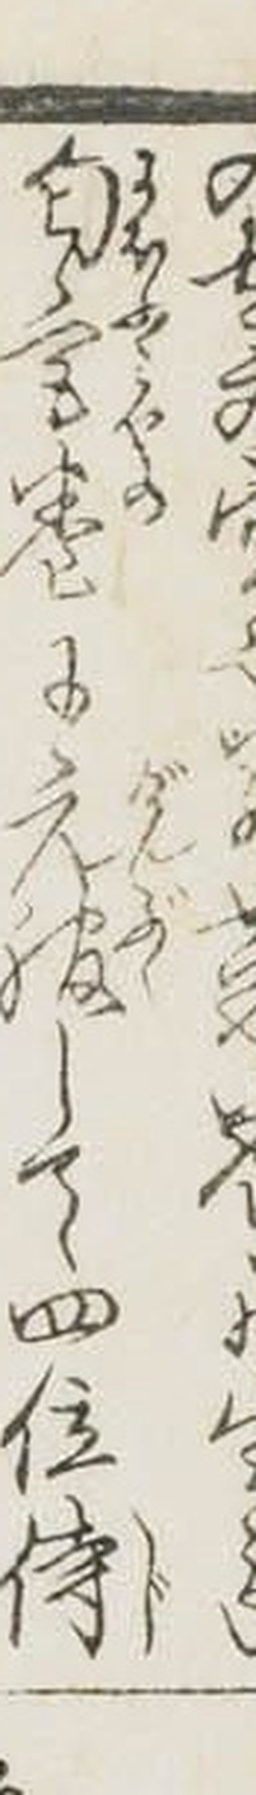匂宮巻に元服して四位侍
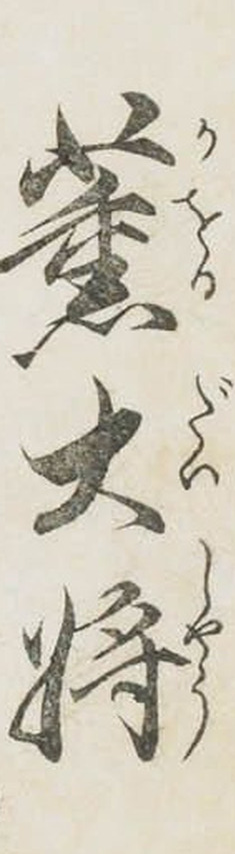薫大将
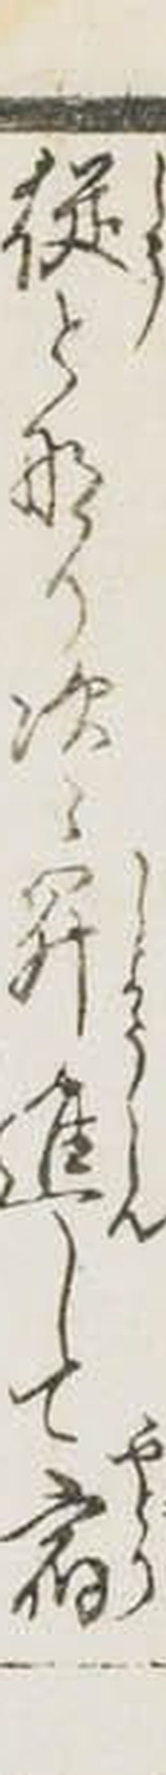従となり次々昇進して宿
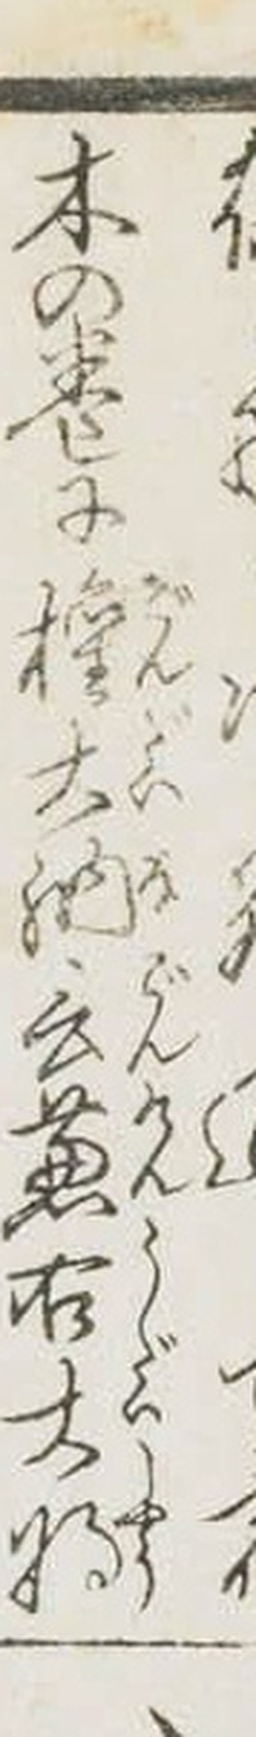木の巻に権大納言兼右大将
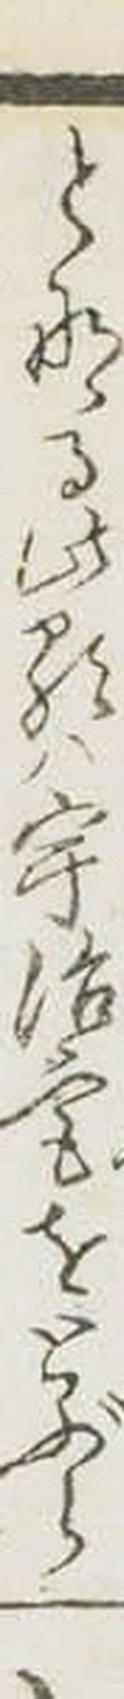となる此歌は宇治宮をとぶら
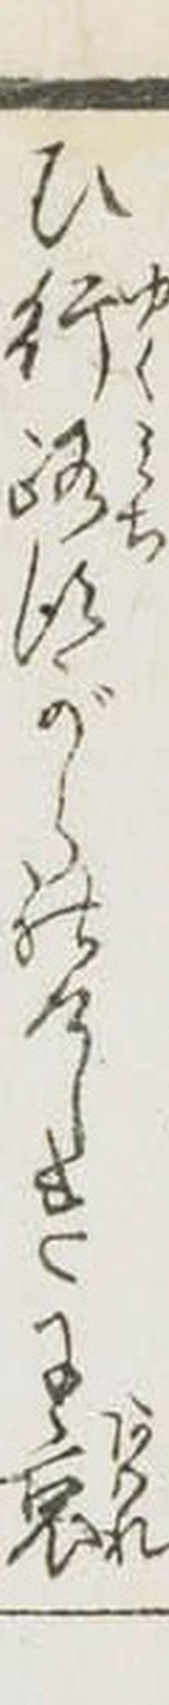ひ行路すがらのけしきに哀
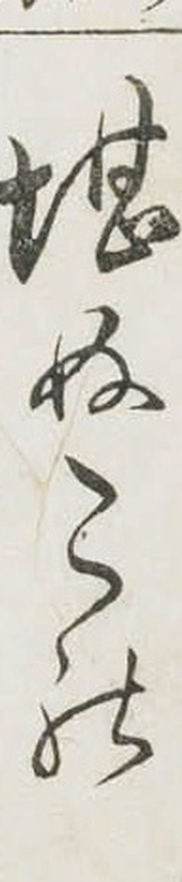堪ぬこの
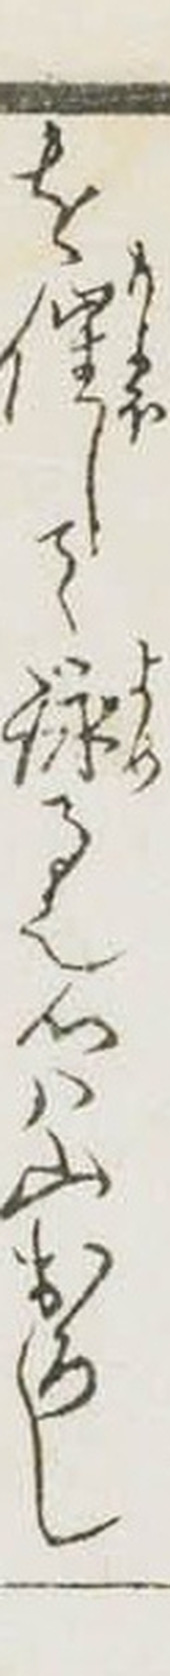を催して詠る也心は山おろし
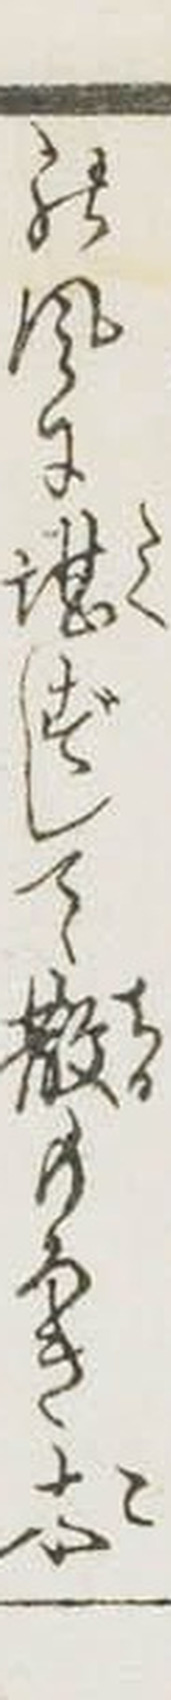の風に堪ずして散もろき木
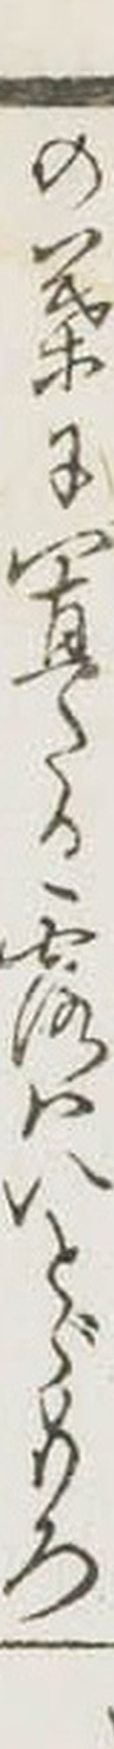の葉に置たる露はいとゞもろ
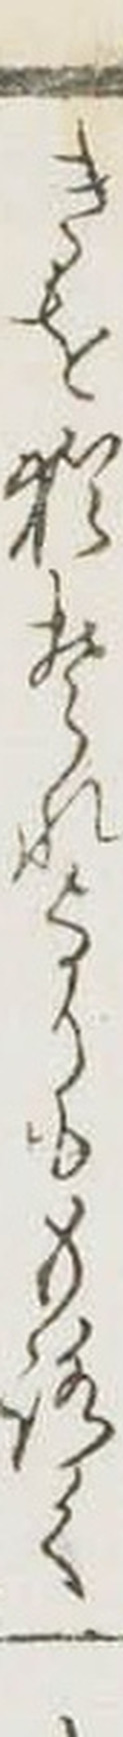きを猶それよりももろく
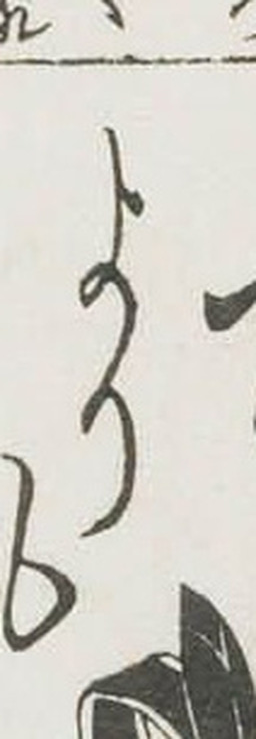よりも
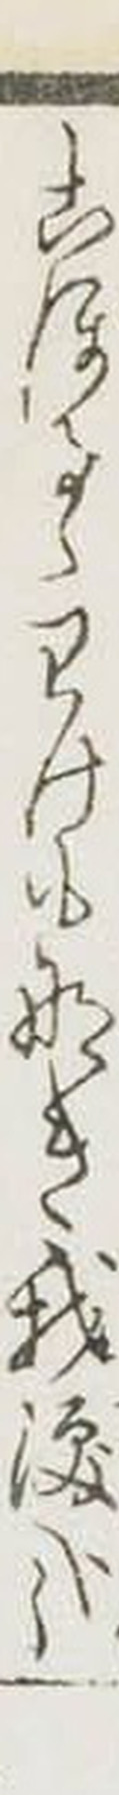こぼるゝわけもなき我涙哉
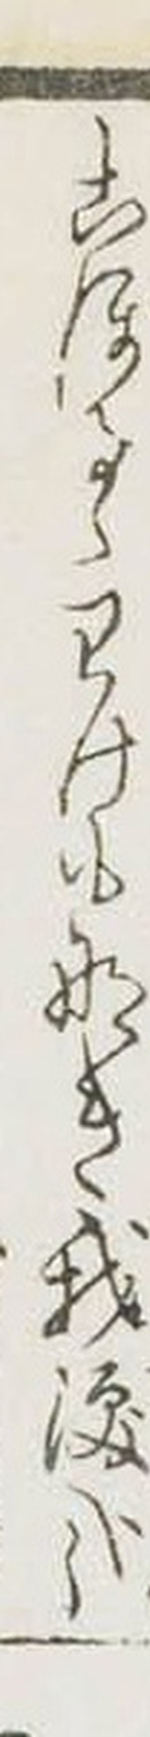こぼるゝわけもなき我涙哉
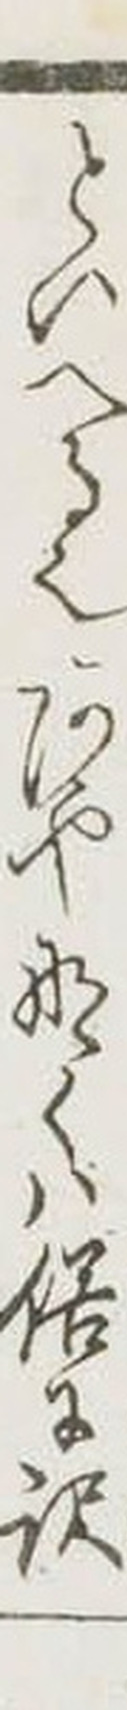といへる也あやなくは俗に訳
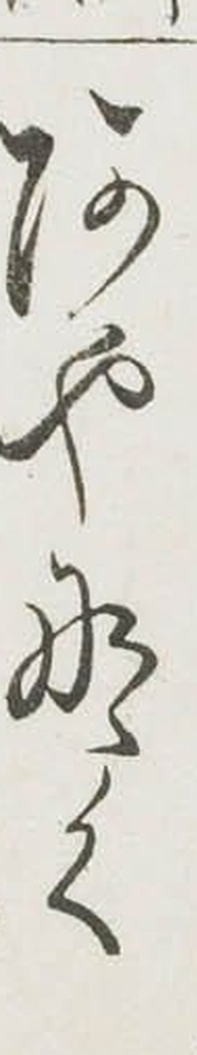あやなく
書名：源氏百人一首
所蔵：東京学芸大学教育コンテンツアーカイブ
